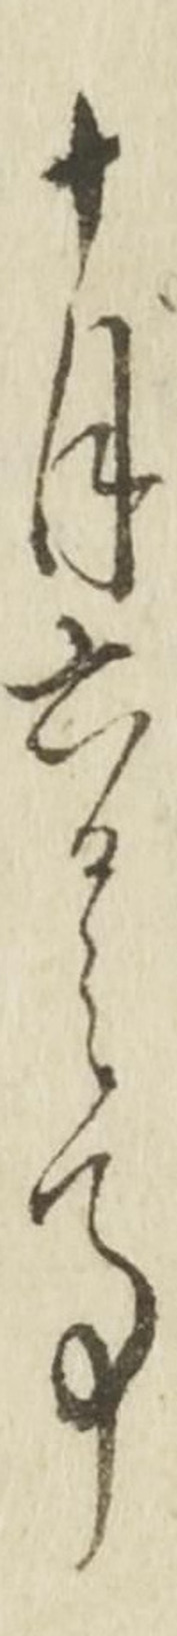十月六日之事
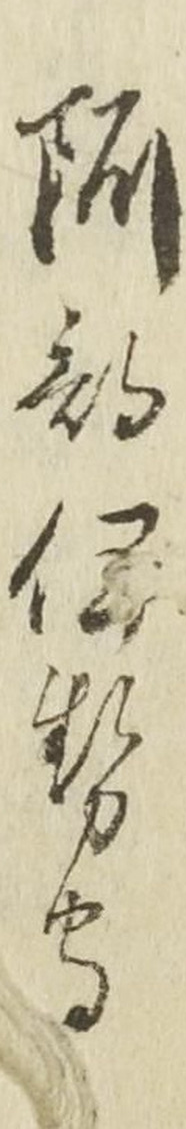阿部伊勢守
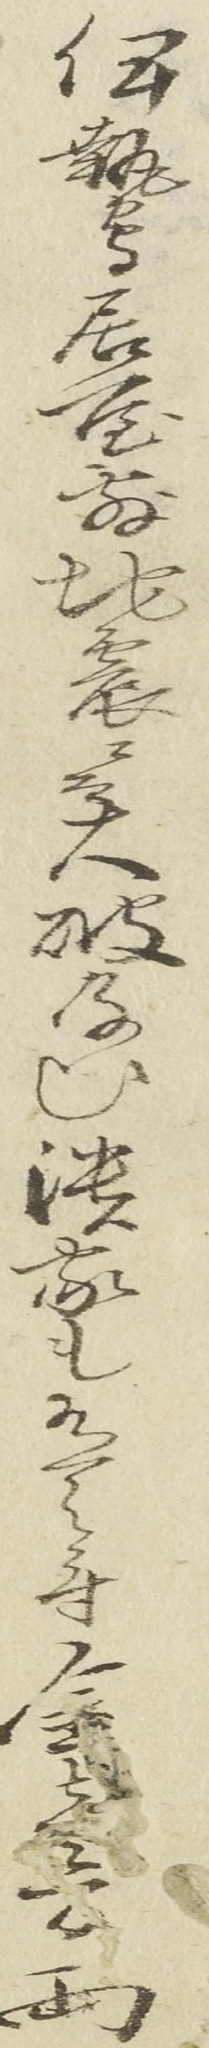伊勢守居屋敷地震ニ而大破及び潰家も有之候ニ付金壱万両
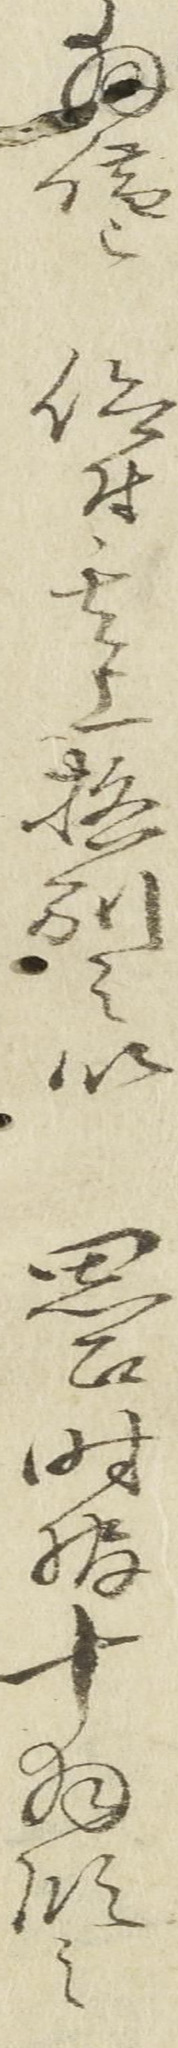拝借被仰付其上格別の以思召時服十拝領之
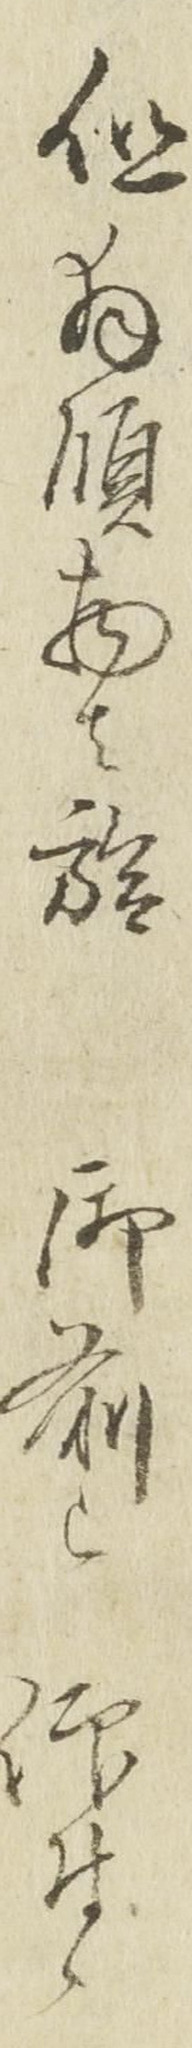但拝領物は於御前被仰付候
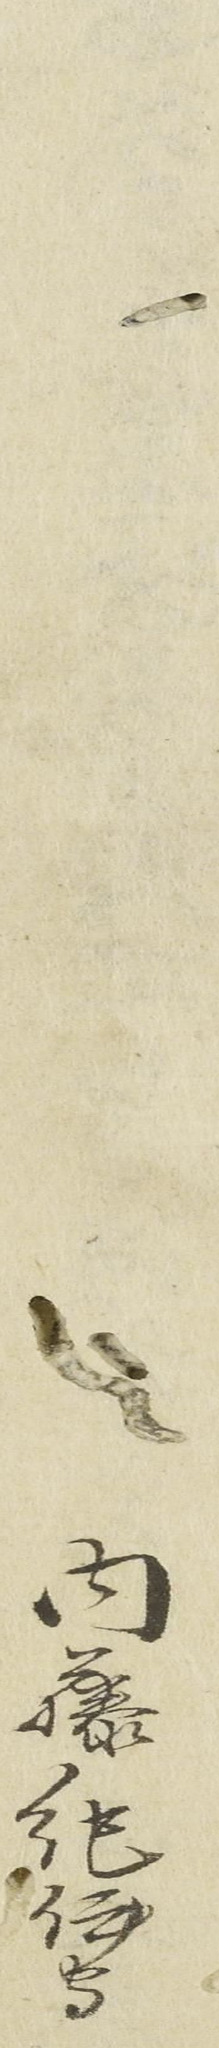内藤紀伊守
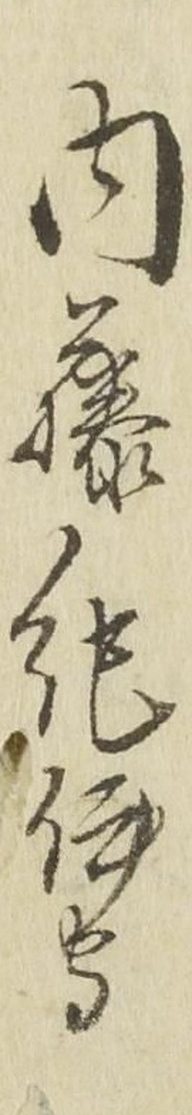内藤紀伊守
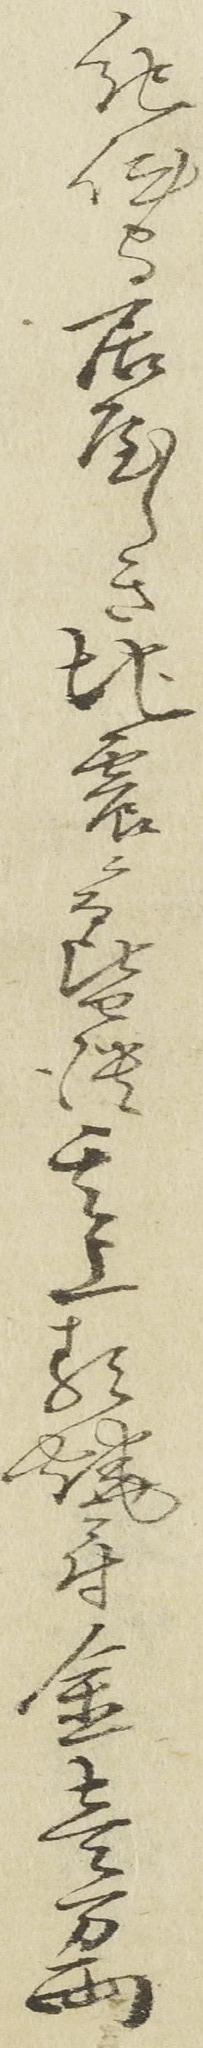紀伊守居屋しき地震ニ而皆潰其上類焼ニ付金壱万両
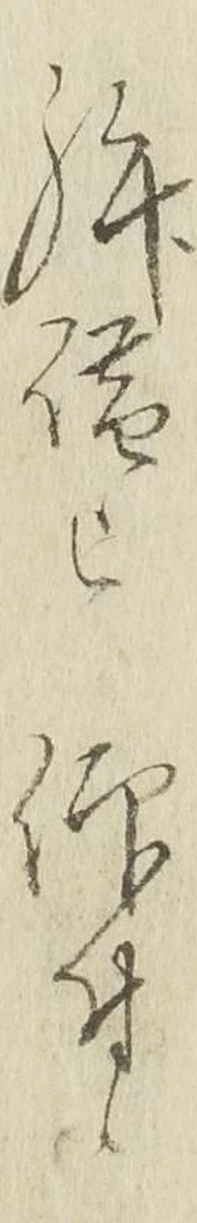拝借被仰付候
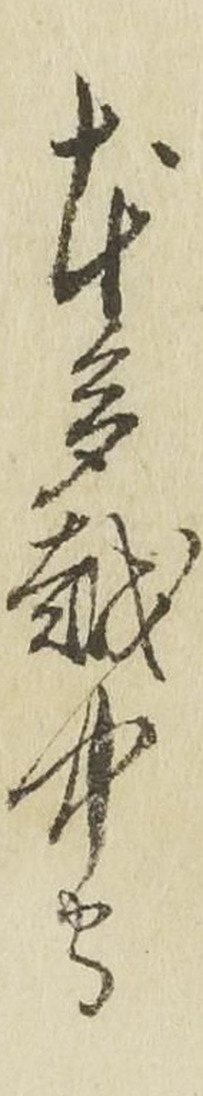本多越中守
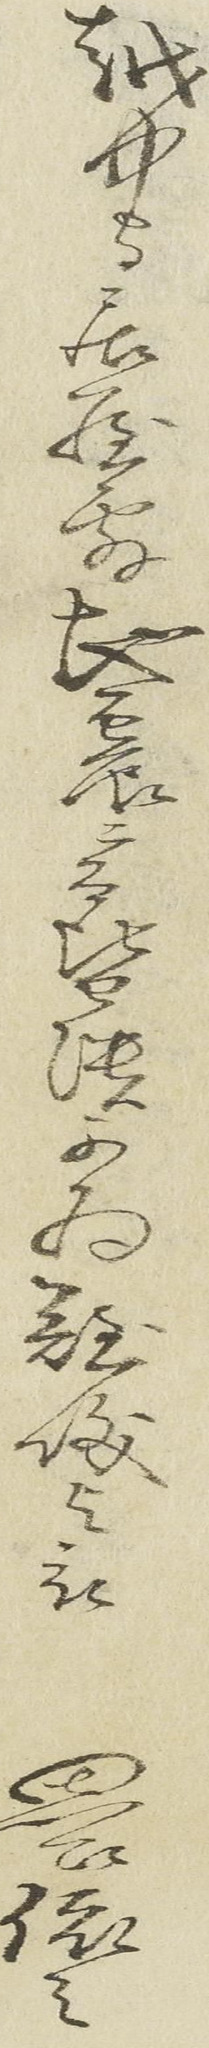越中守居屋敷地震ニ而皆潰可為難儀と被思召依之
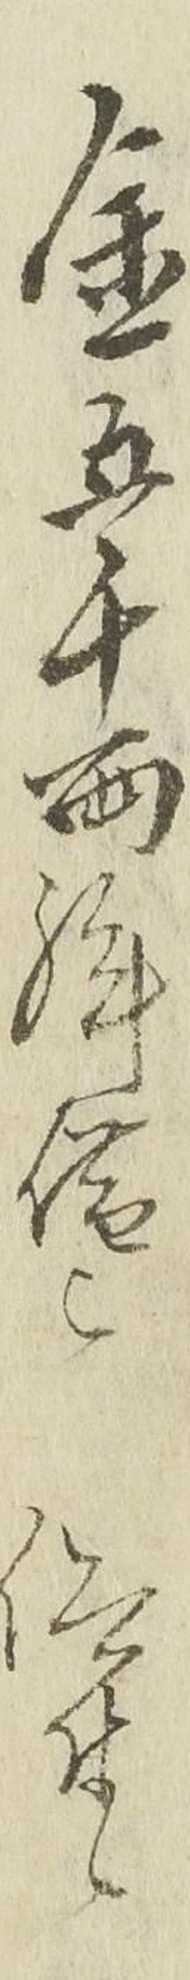金五千両拝借被仰付候
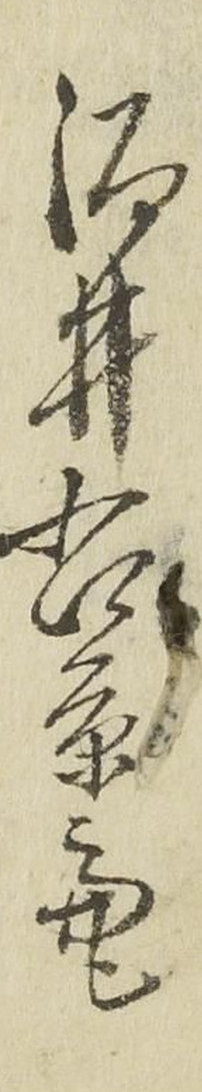酒井右京亮
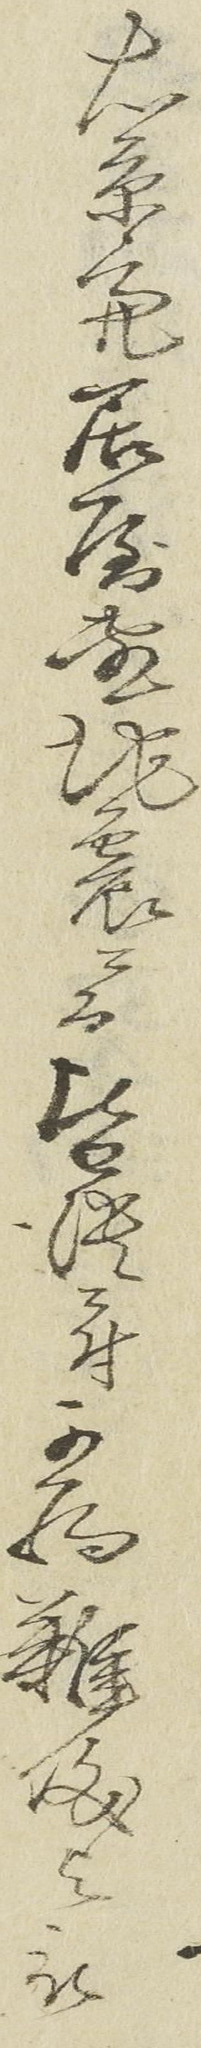右京亮居屋敷地震ニ而皆潰ニ付可為難儀と被

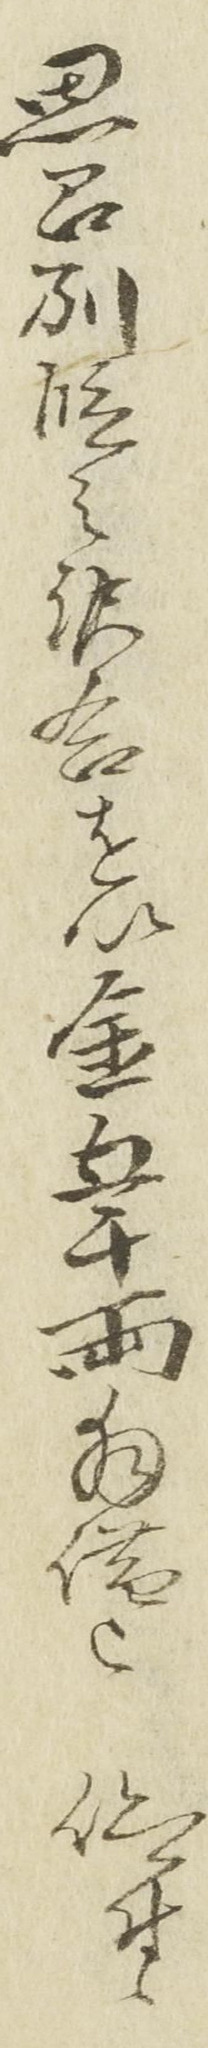思召別段之訳合を以金五千両拝借被仰付候
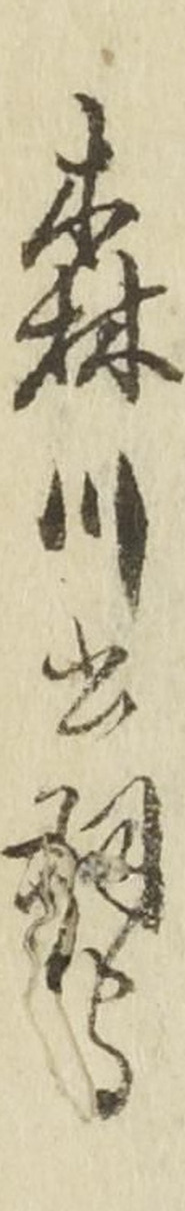森川出羽守
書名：安政二乙卯年十月二日大地震之事
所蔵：東京大学地震研究所図書室 Earthquake Research Institute Library, The University of Tokyo, JAPAN
